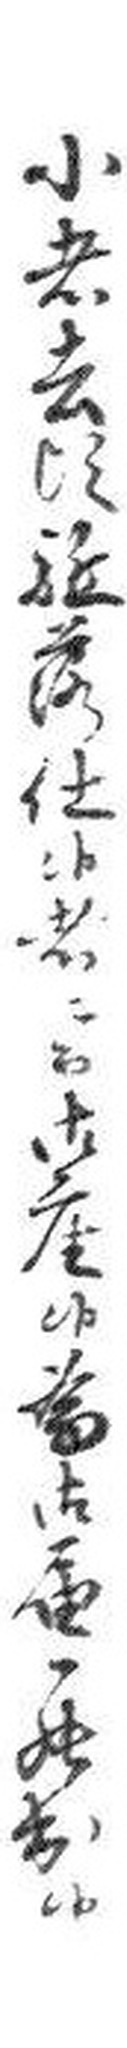小者去頃駈落仕候者ニ而御座候為御届罷出候
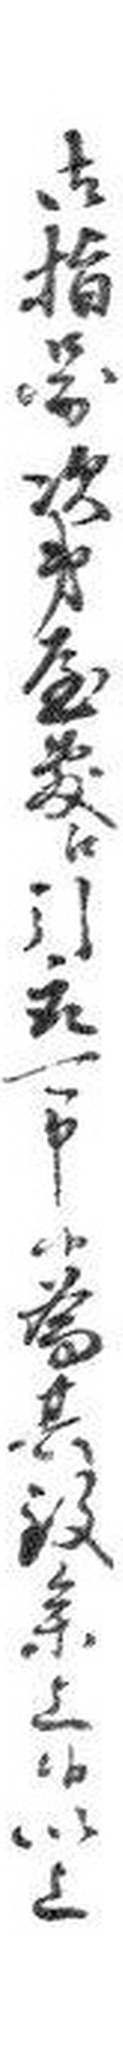御指図次第屋敷江引取可申候其為致参上候以上
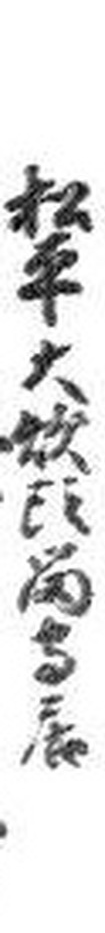松平大炊頭留守居
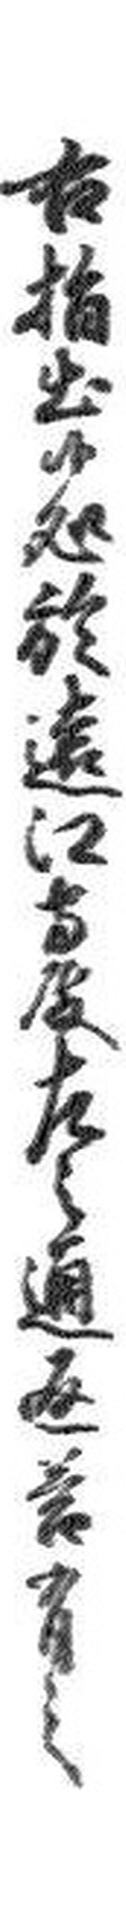右指出候処於遠江守殿左之通返答有之
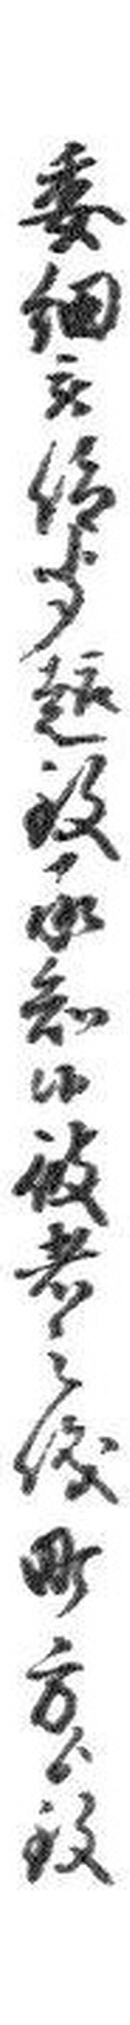委細被仰聞趣致承知候彼者之儀町方ゟ致
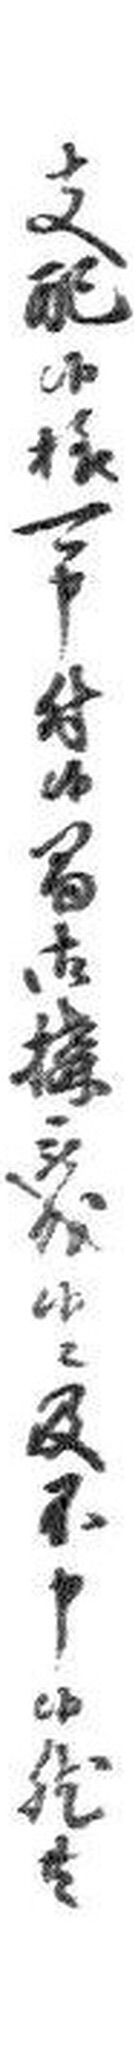支配候様可申付候間御構被成候ニ及不申候然共
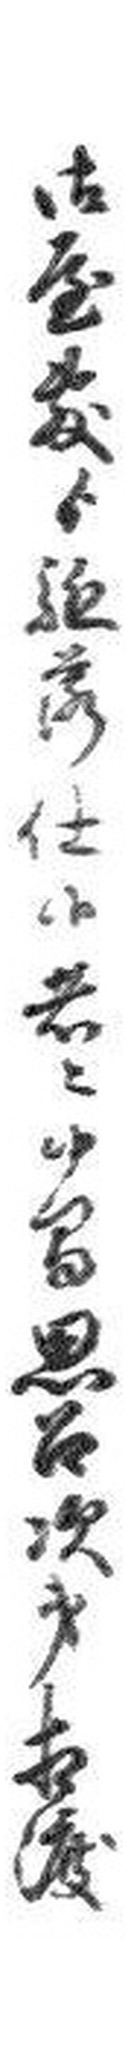御屋敷ゟ駈落仕候者ニ候間思召次第相渡
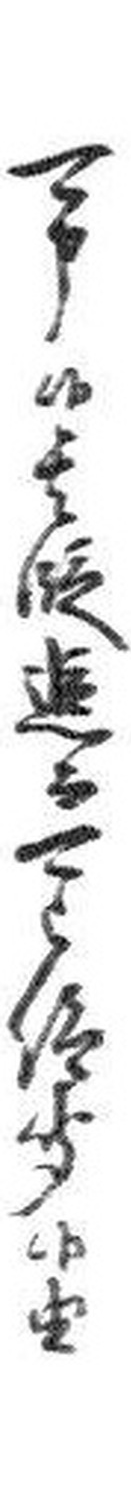可申候其段追而可被仰聞候由
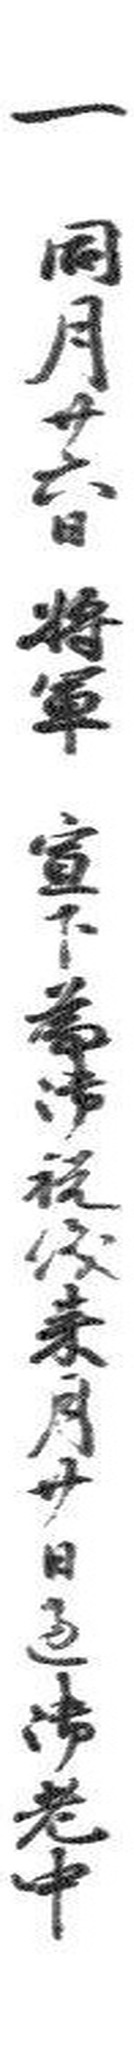一同月廿六日将軍宣下為御祝儀来月廿日迄御老中

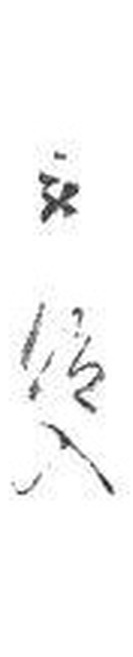被仰入
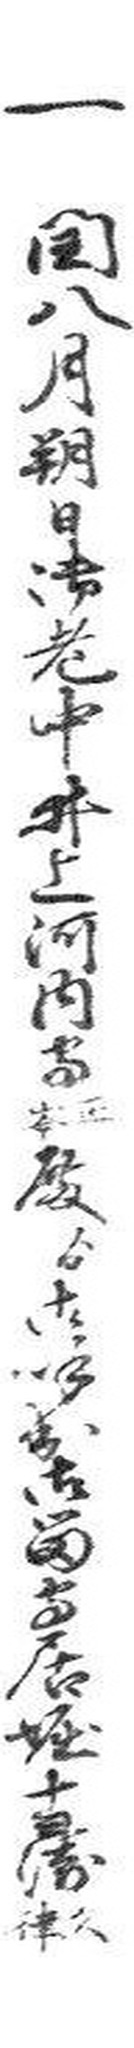一閏八月朔日御老中井上河内守正岑殿ゟ御呼出御留守居堀十兵衛久律
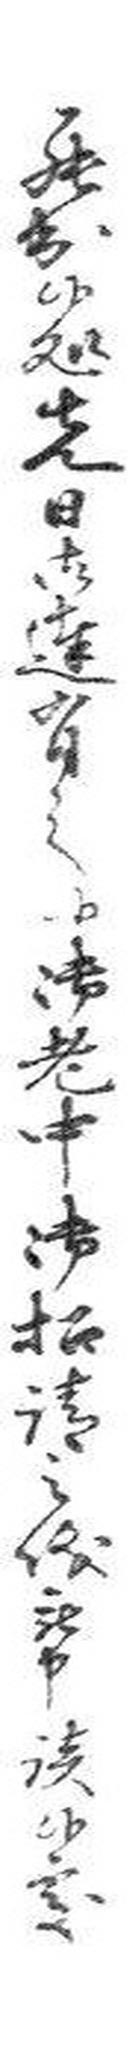罷出候処先日御達有之候御老中御招請之儀被申談候処
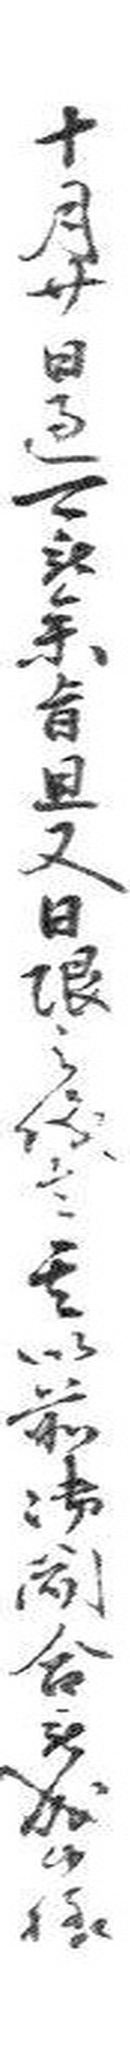十月廿日過可被参旨且又日限之儀者其以前御聞合被成候様
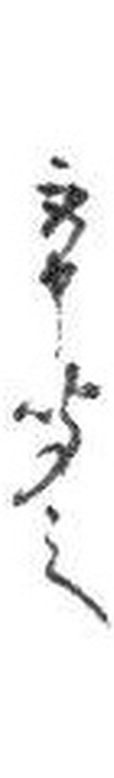被申聞之
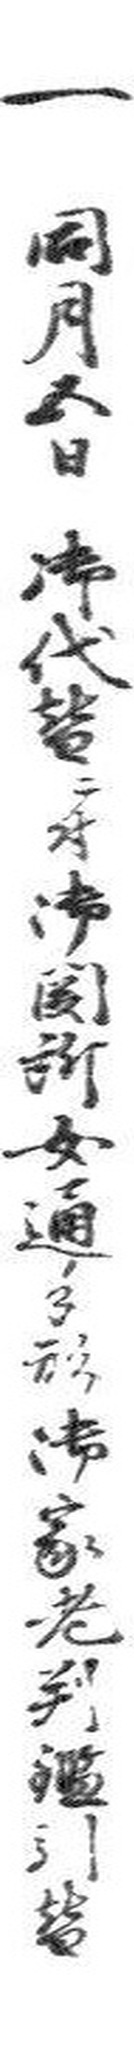一同月五日御代替ニ付御関所女通手形御家老判鑑引替
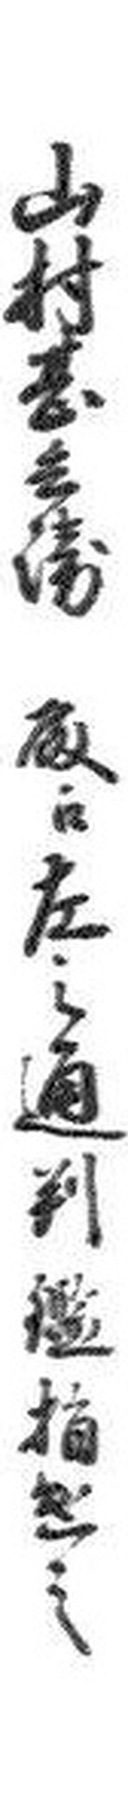山村甚兵衛殿江左之通判鑑指遣之
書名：家譜 二十八 吉邦公 従宝永七年七月五日到正徳元年十二月
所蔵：福井県文書館 Fukui Prefectural Archives
